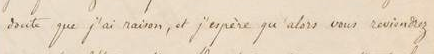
doute que j'ai raison, et j'espère qu'alors vous reviendrez
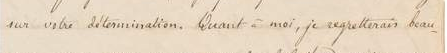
sur votre détermination. Quant à moi, je regretterais beau-
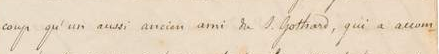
coup qu'un aussi ancien ami du S. Gothard, qui a accom-
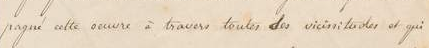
pagné cette oeuvre à travers toutes ses vicissitudes et qui
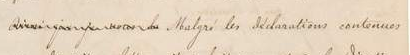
Ainsi que je vous le Malgré les déclarations contenues
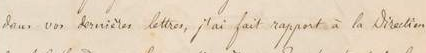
dans vos dernières lettres, j'ai fait rapport à la Direction
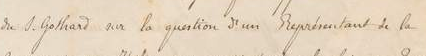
de S. Gothard sur la question d'un Représentant de la
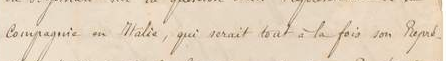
Compagnie en Italie, qui serait tout à la fois son Repré-
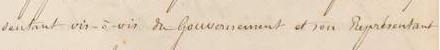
sentant vis-à-vis du Gouvernement et son Représentant
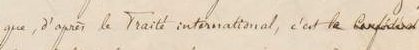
que, d'après le Traité international, c'est le Confédérat
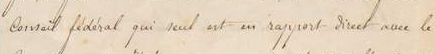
Conseil fédéral qui seul est en rapport direct avec le
